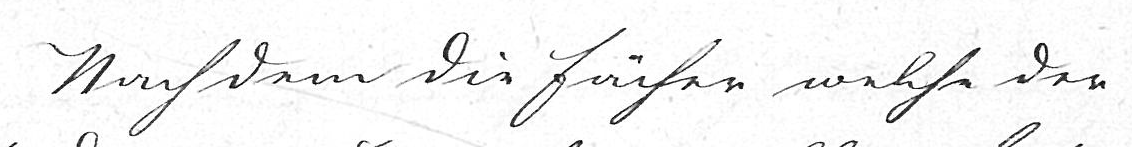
Nachdem die Fächer welche der
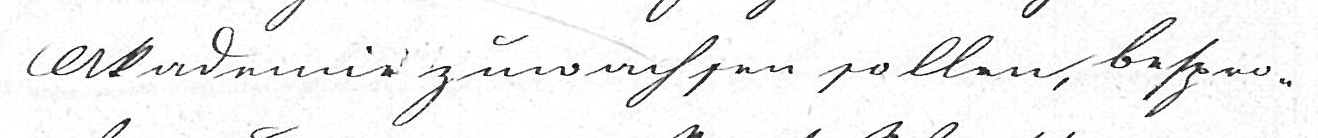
Akademie zuwachsen sollen, bespro-
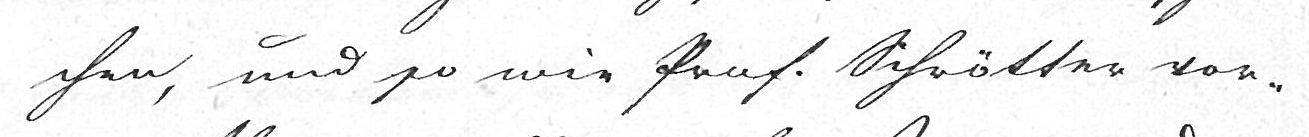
chen, und so wie Prof. Schrötter vor-
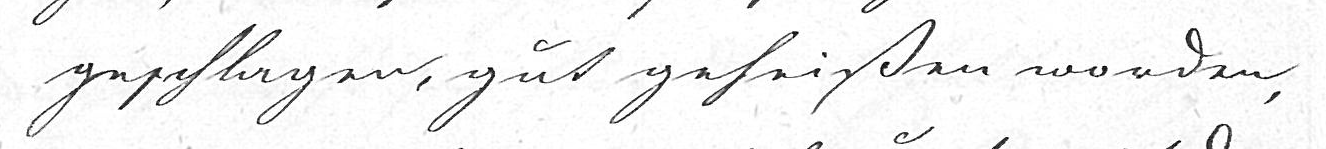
geschlagen, gut geheißen worden,
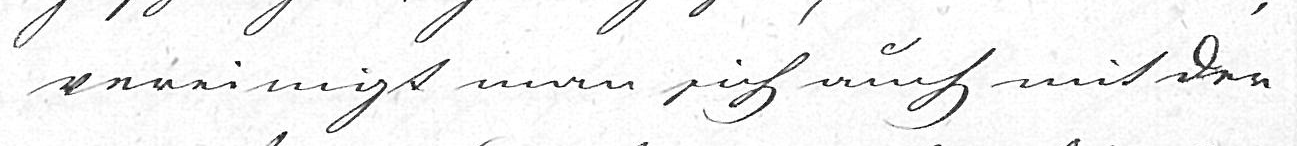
vereinigt man sich auch mit der
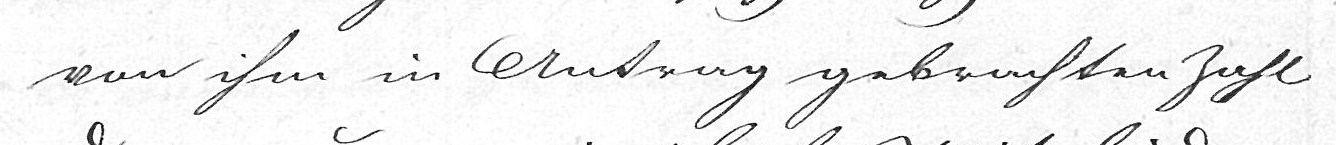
von ihm in Antrag gebrachten Zahl
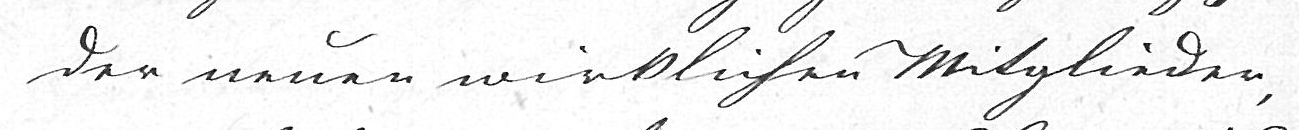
der neuen wirklichen Mitglieder,
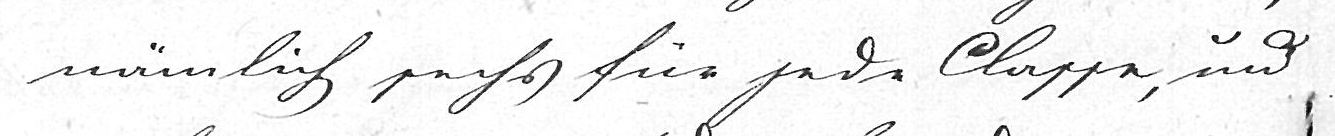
nämlich sechs für jede Classe, und
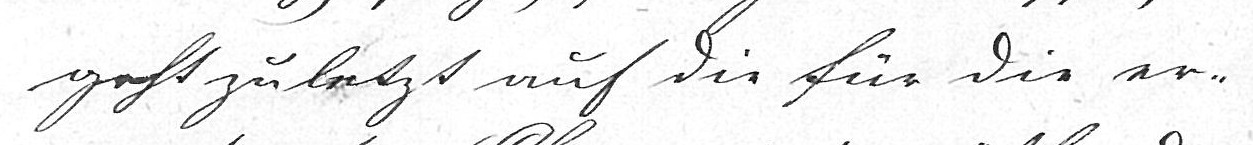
geht zuletzt auf der für die er-
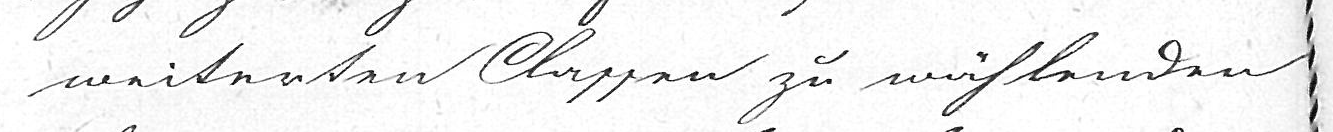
weiterten Classen zu wählenden
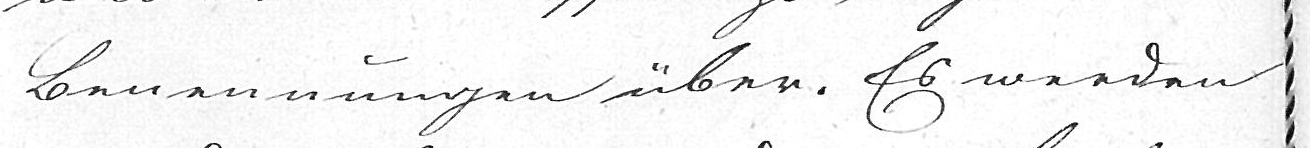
Benennungen über. Es werden
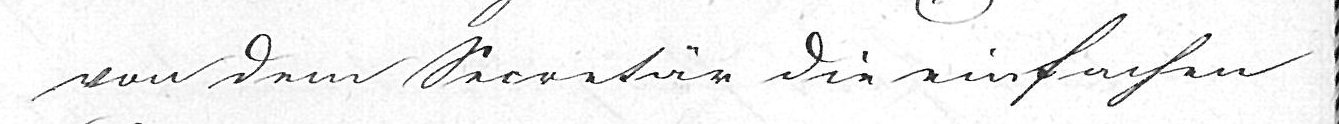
von dem Secretär die einfachen
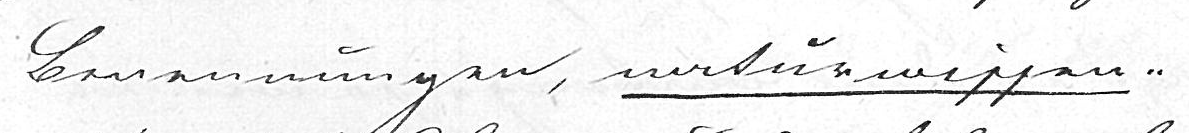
Benennungen, naturwissen-
